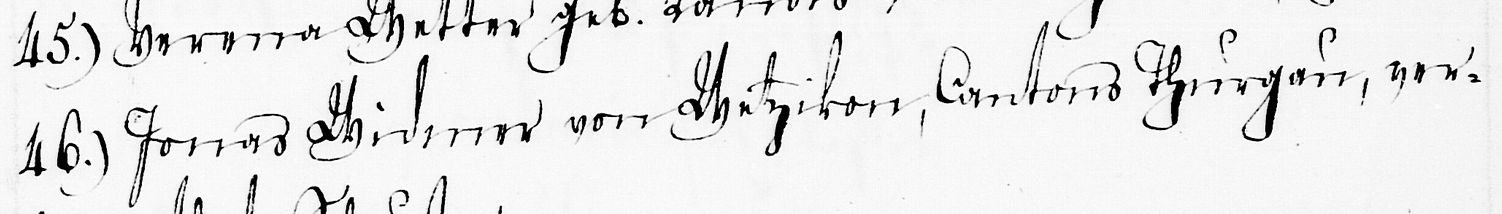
46.) Jonas Widmer von Wetzikon, Cantons Thurgau, ver¬
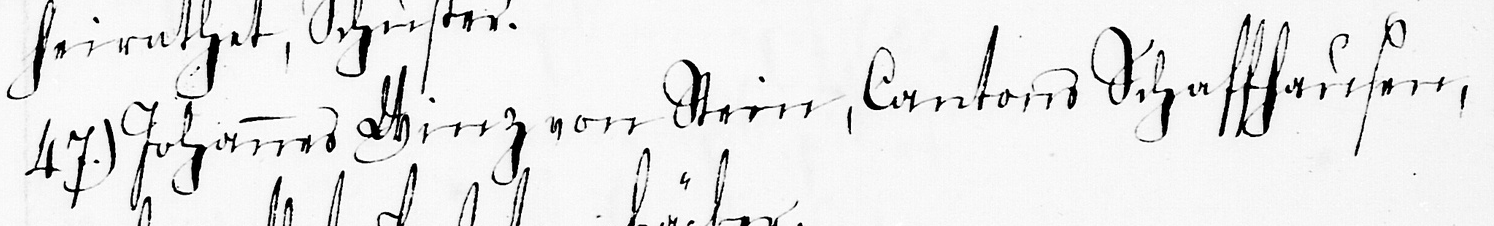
47.) Johannes Winz von Stein, Cantons Schaffhausen,
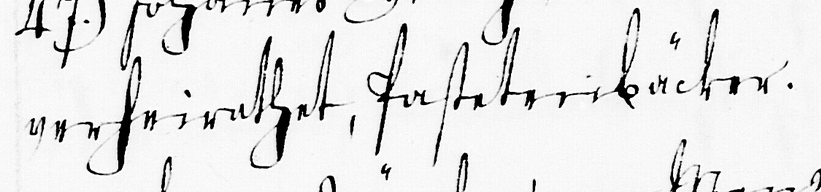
verheirathet, Pastetenbäcker.
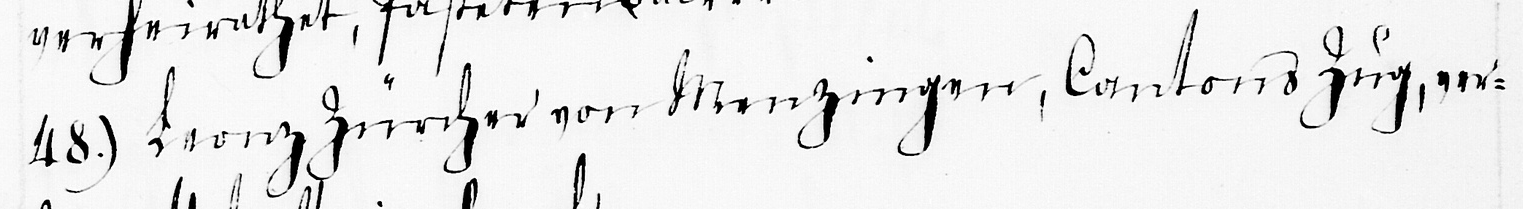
48.) Leonz Zürcher von Menzingen, Cantons Zug, ver¬
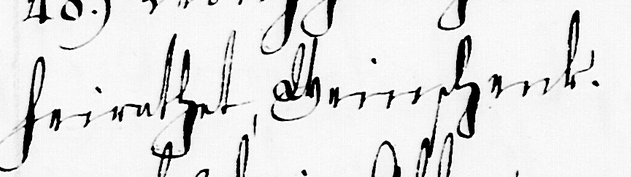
heirathet, Weinschenk.
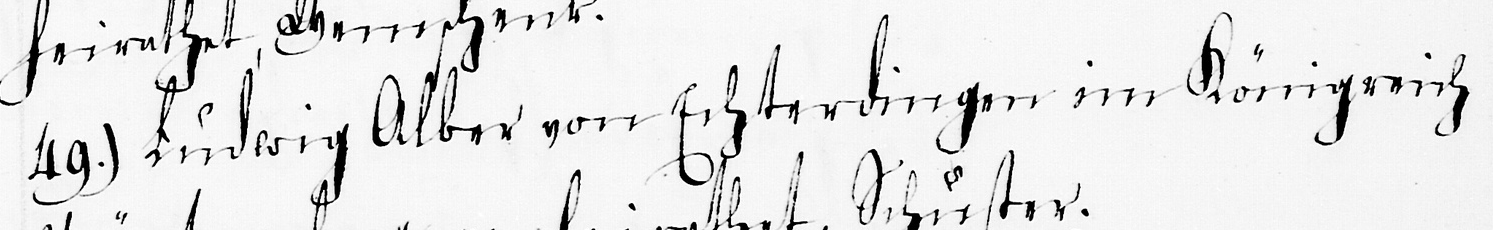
49.) Ludwig Alber von Echterdingen im Königreich
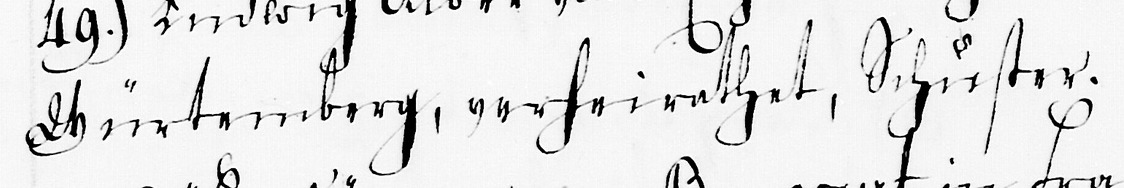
Würtemberg, verheirathet, Schuster.
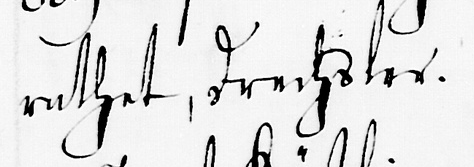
rathet, Drechsler.
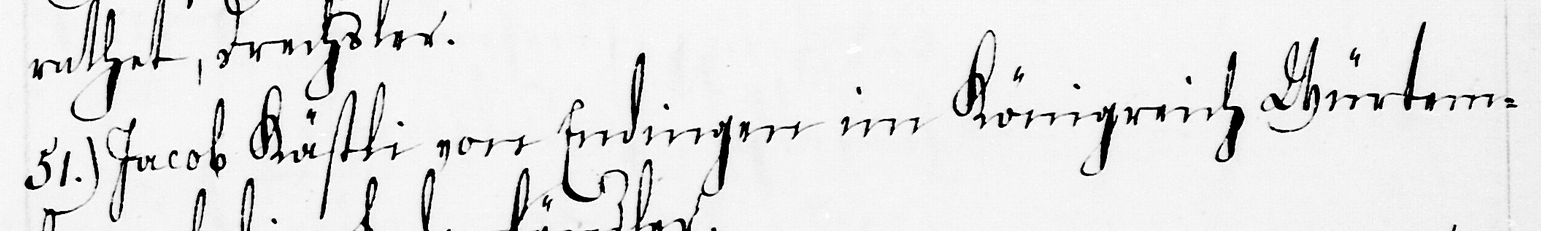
51.) Jacob Kästli von Endingen im Königreich Würtem¬
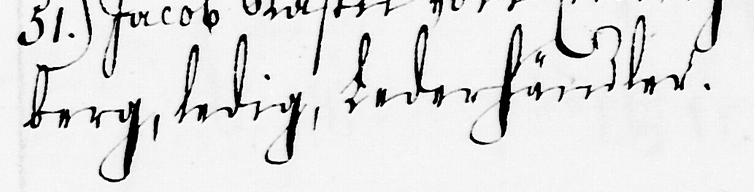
berg, ledig, Lederhändler.
